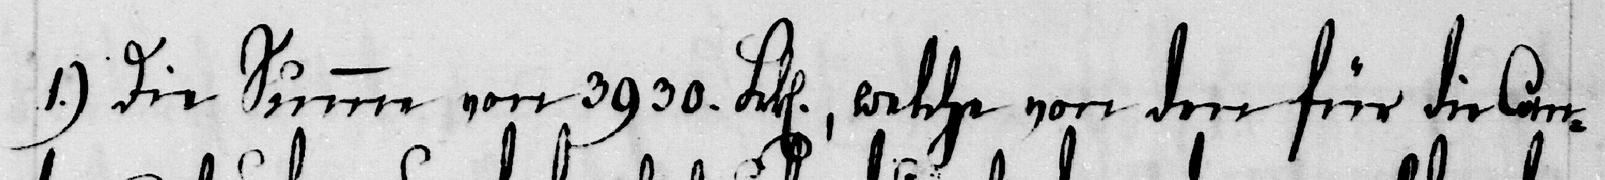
1.) Die Summe von 3930. Frk[en]., welche von den für die Can¬
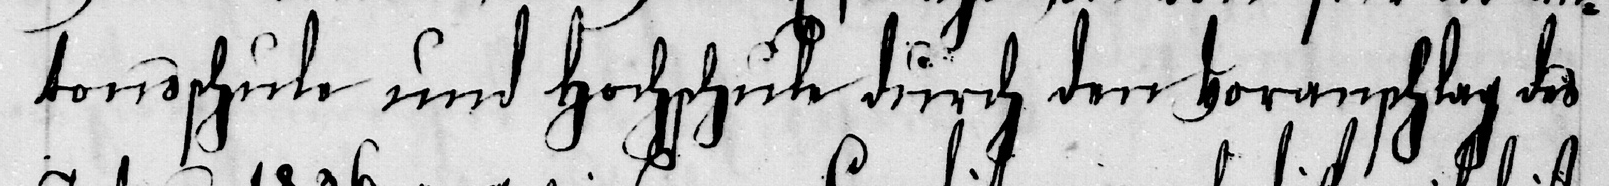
tonsschule und Hochschule durch den Voranschlag des
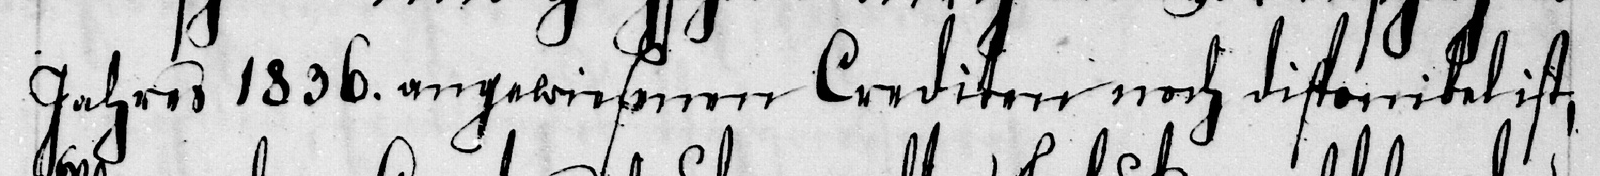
Jahres 1836. angewiesenen Crediten noch disponibel ist,
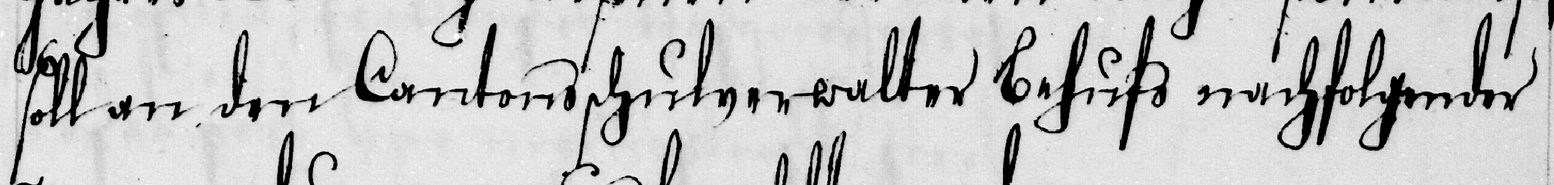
soll an den Cantonsschulverwalter Behufs nachfolgender
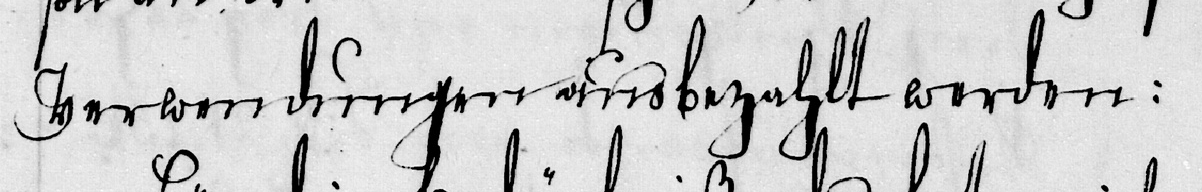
Verwendungen ausbezahlt werden:
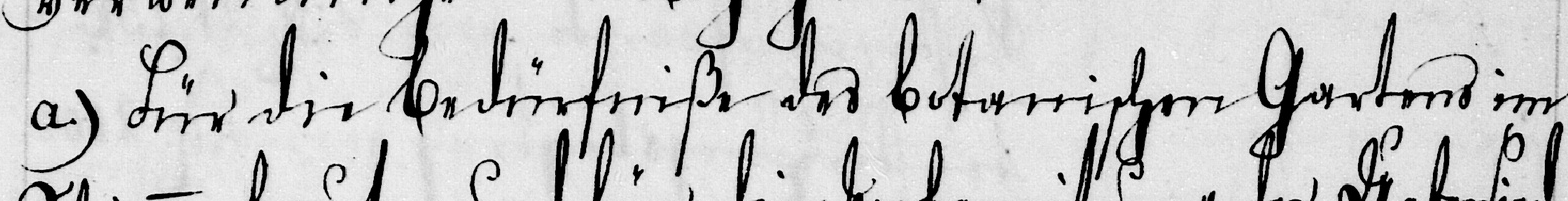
a.) Für die Bedürfniße des botanischen Gartens im
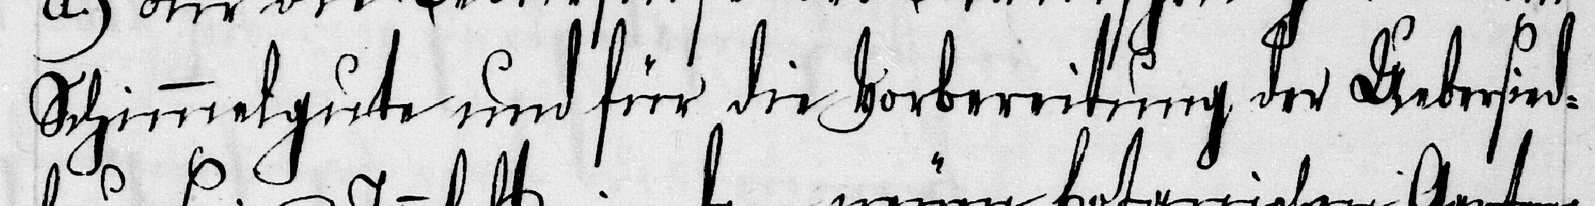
Schimmelgute und für die Vorbereitung der Uebersie¬
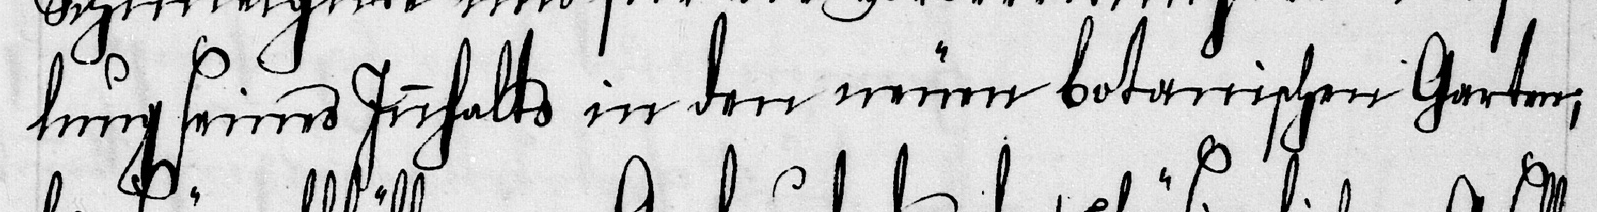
dlung seines Innhalts in den neuen botanischen Garten,
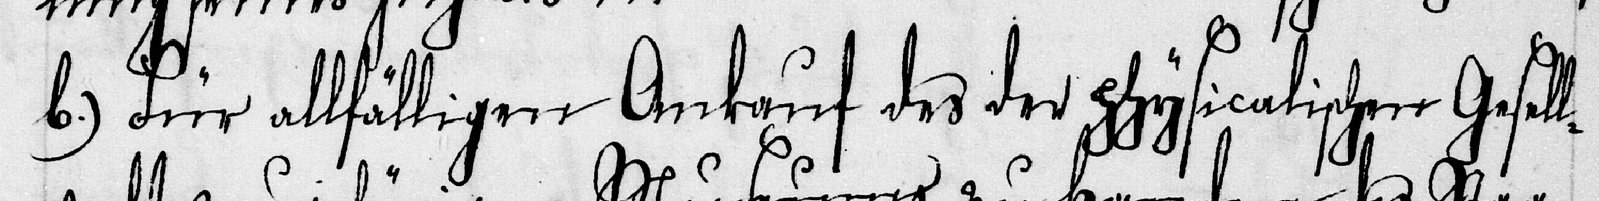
b.) Für allfälligen Ankauf des der physicalischen Gesel¬
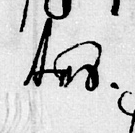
tes.
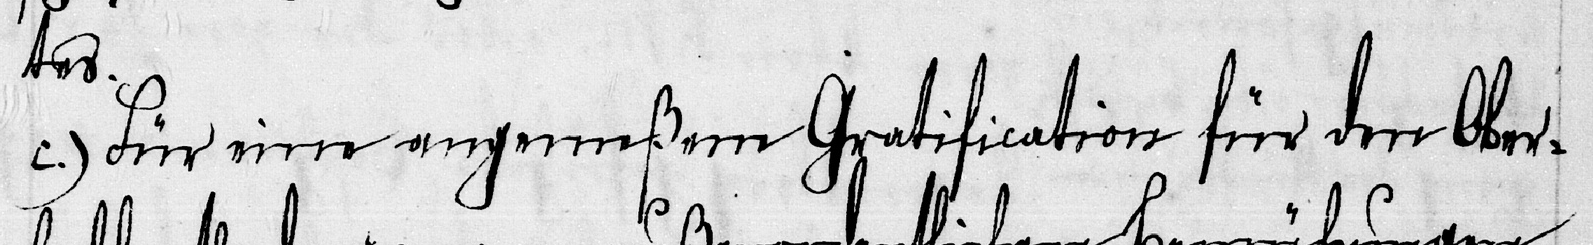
c.) Für eine angemeßene Gratification für den Ober¬
